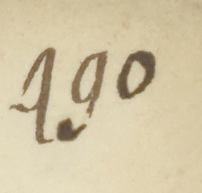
490
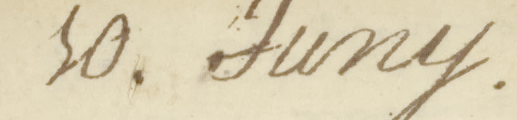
10. Juny.
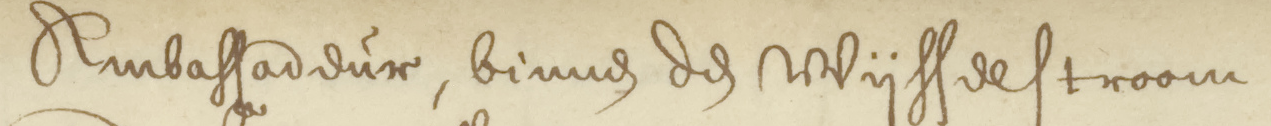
Ambassadeur, binnen den Wijsselstroom
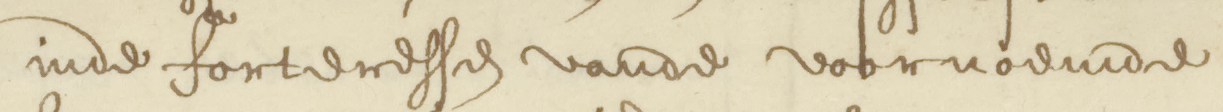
inde forteressen vande voornoemde
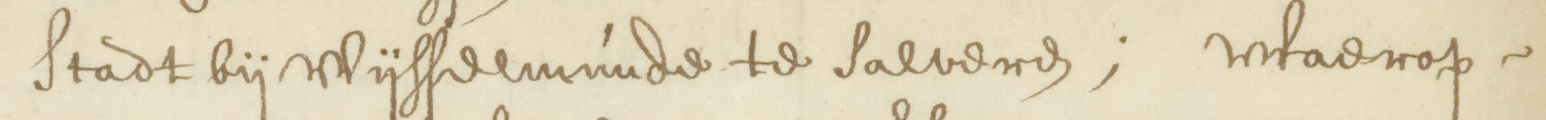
Stadt bij Wijsselmunde te Salveren; Waerop
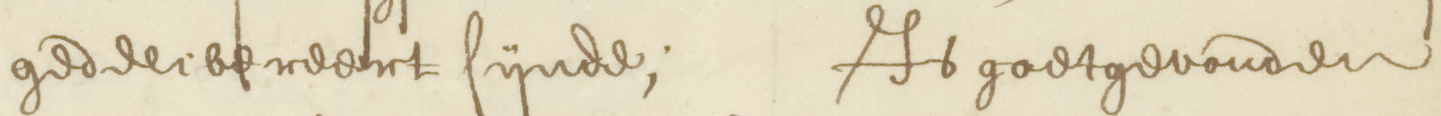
gedelibereert sijnde; Is goetgevonden
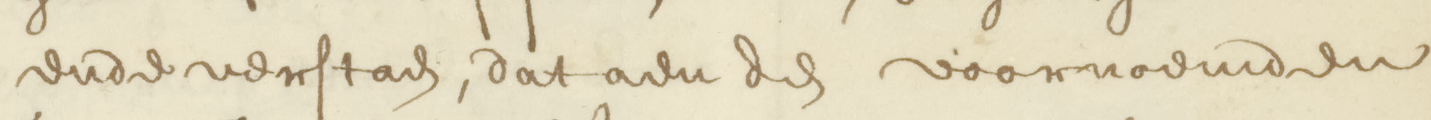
ende verstaen, dat aen den voornoemden
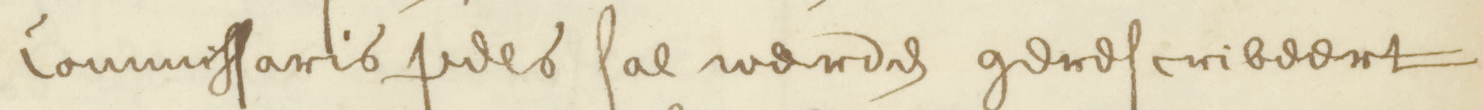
Commissaris pels sal werden gerescribeert
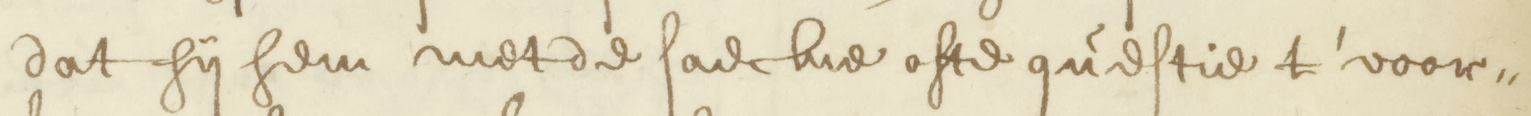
dat hij hem met de saecke ofte questie t‛voor„
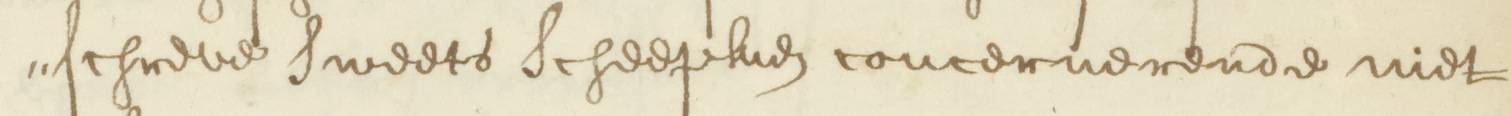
„schreve Sweets Scheepken concernerende niet
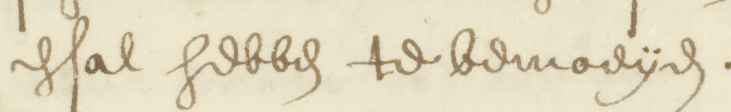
en sal hebben te bemoeijen.
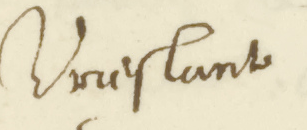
Vrieslant
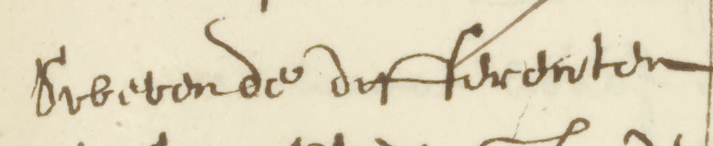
Swevende differenten
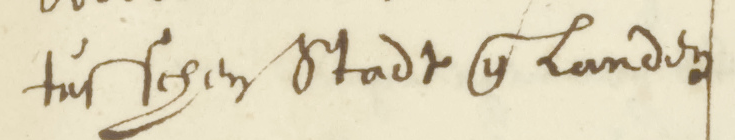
tusschen Stadt & Landen
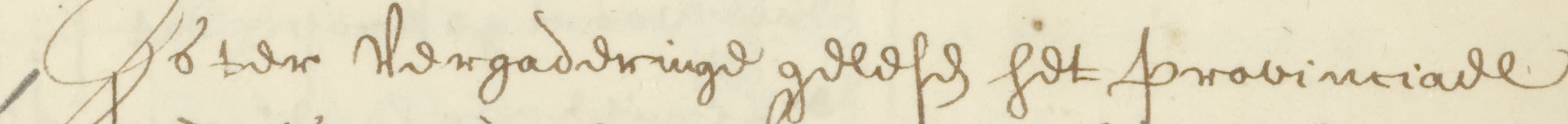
Is ter Vergaderinge gelesen het Provinciael
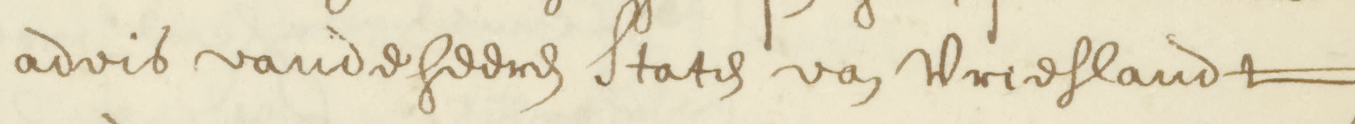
advis vande heeren Staten van Vrieslandt
